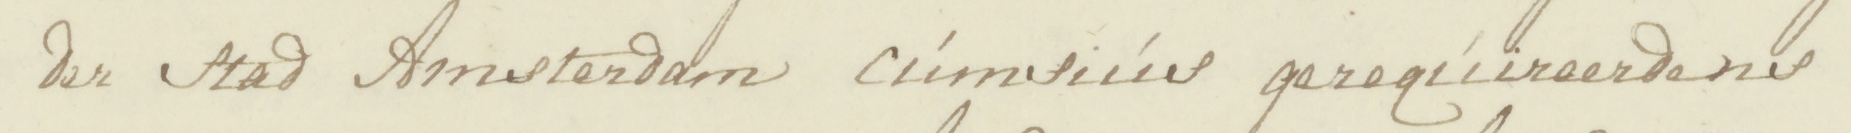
der stad Amsterdam cumsuis gerequireerdens
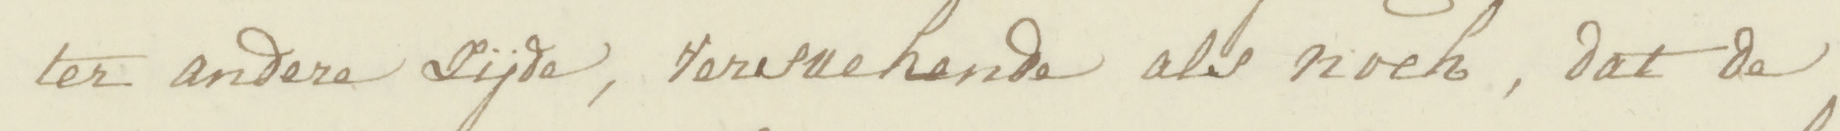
ter andere zijde, versoekende als noch, dat de
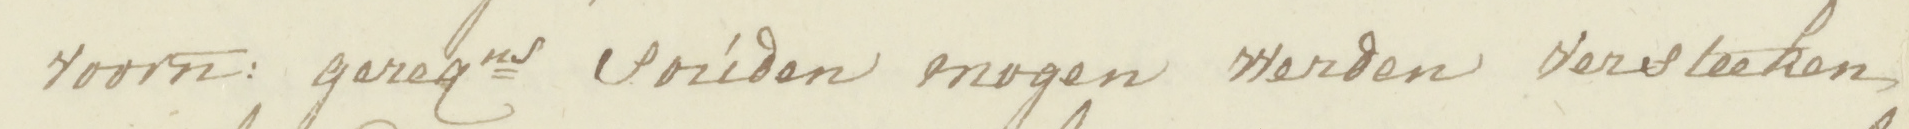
voorn: gereqns souden mogen werden versteeken,
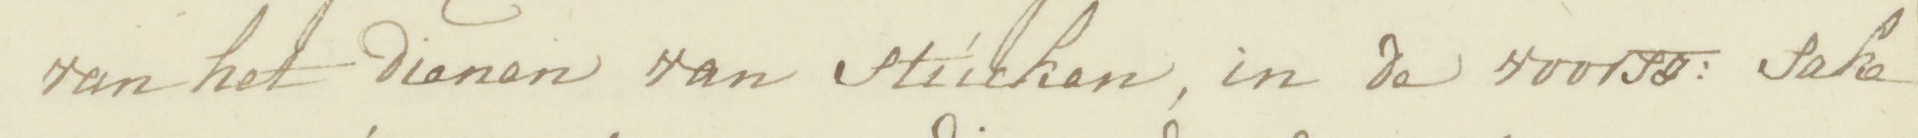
van het dienen van stucken, in de voorsz: sake
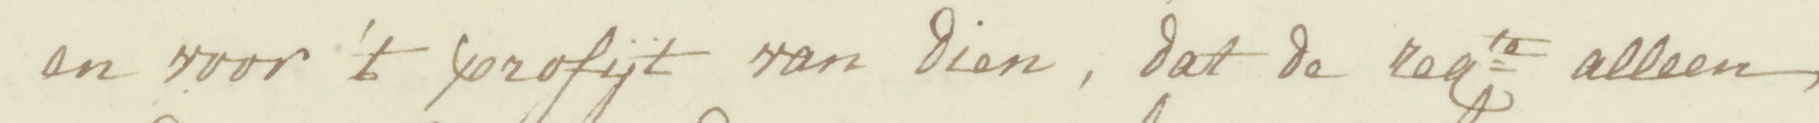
en voor 't profijt van dien, dat de reqte alleen
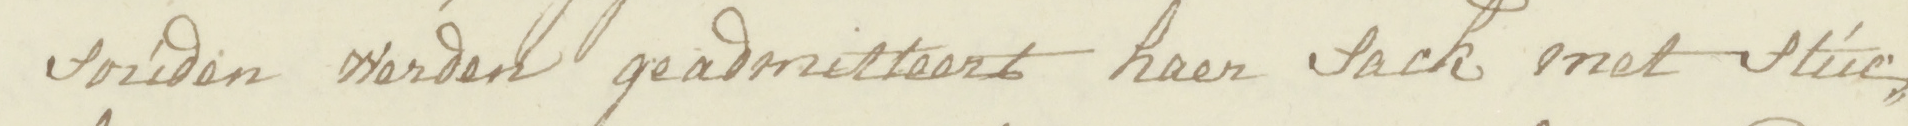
souden worden geadmitteert haer sack met stuc,,
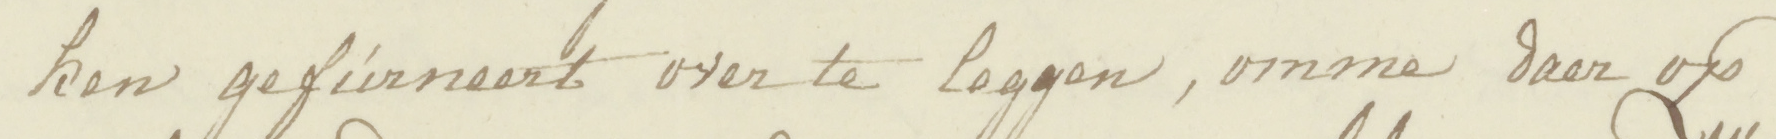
ken gefurneert over te leggen, omme daar op
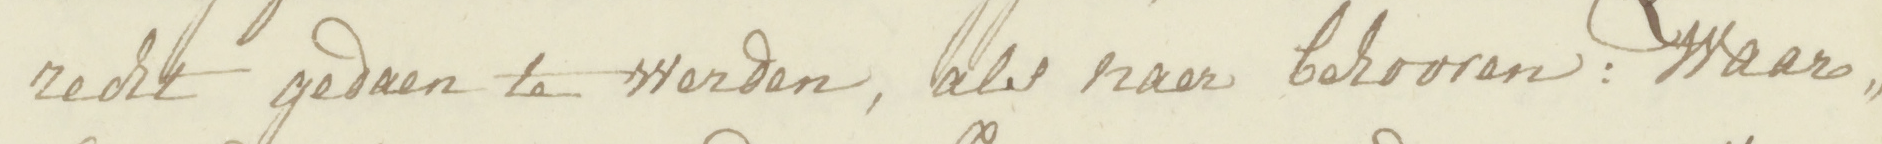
recht gedaen te werden, als naer behooren: Waar,,
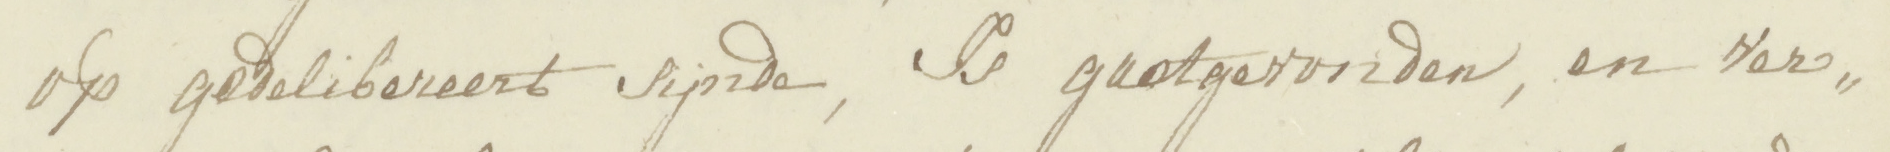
op gedelibereert sijnde, Is goetgevonden, en ver,,
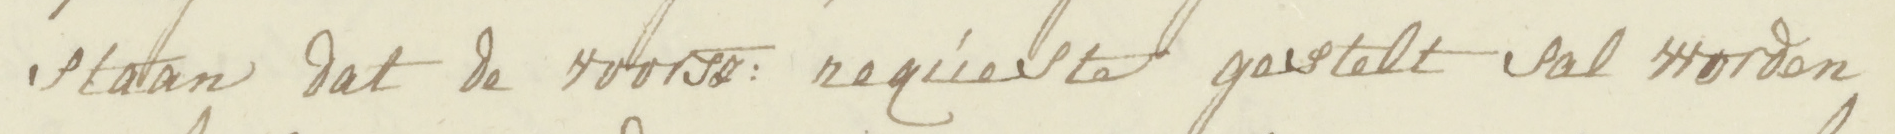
staan dat de voorsz: requeste gestelt sal worden
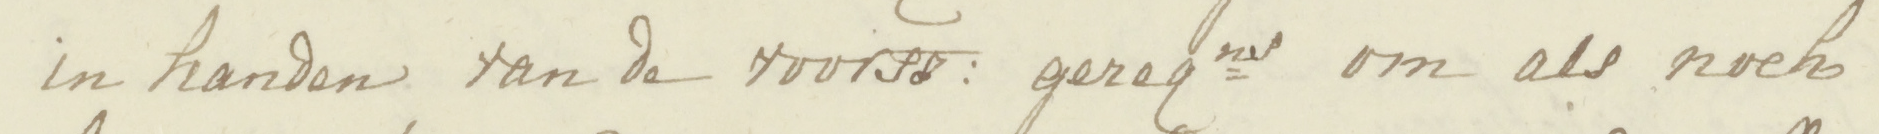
in handen van de voorsz: gereqns om als noch
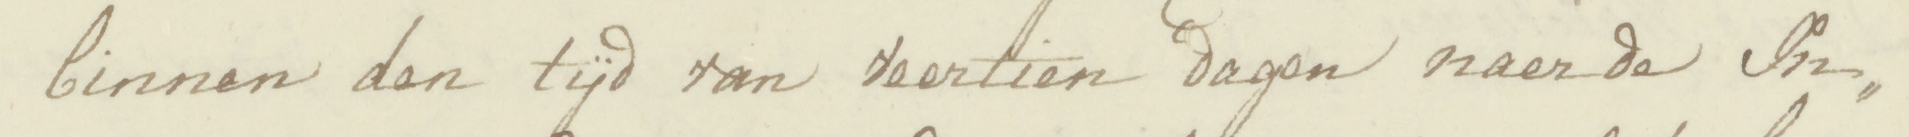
binnen den tijd van veertien dagen naer de In,,
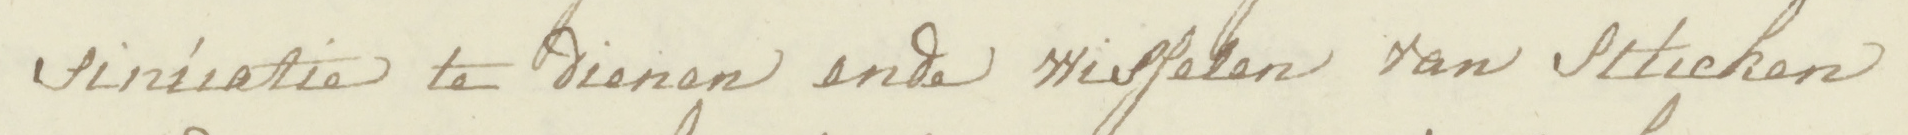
sinuatie te dienen ende wisselen van stucken
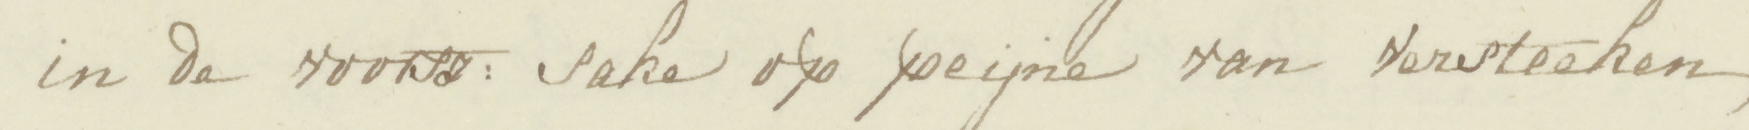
in de voorsz: sake op peijne van versteeken
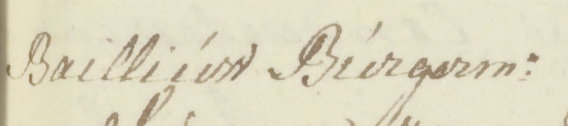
Bailliuw Burgermn.
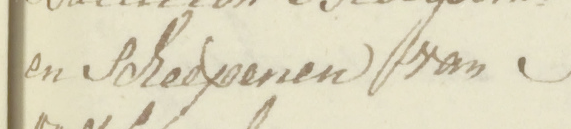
en Schepenen van
